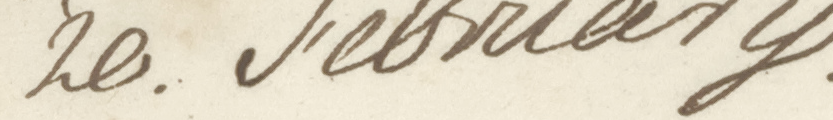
20. Februarij
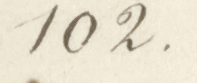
102.
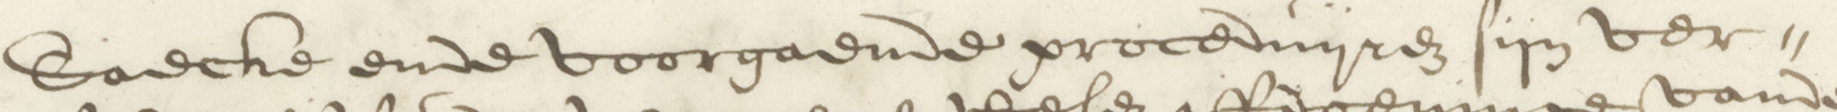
Saecke ende voorgaende proceduijren sijn ver„
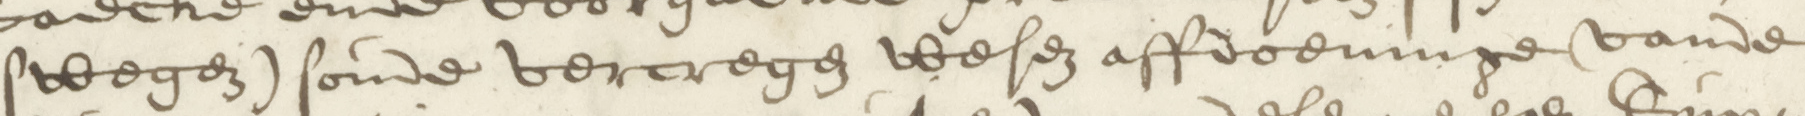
swegen) soude vercregen wesen affdoeninge vande
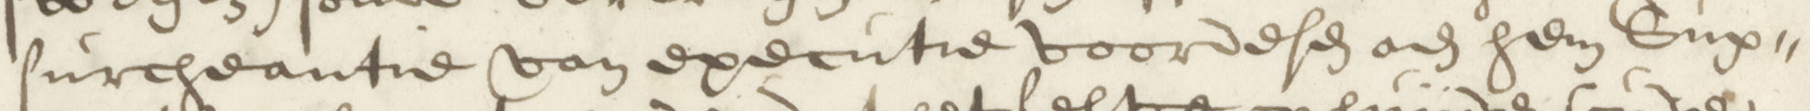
surcheantie van executie voordesen aen hem Sup„
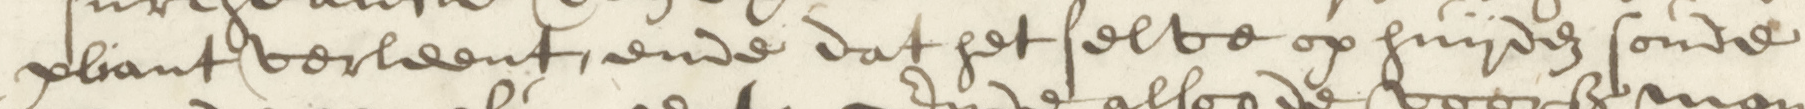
pliant verleent, ende dat het selve op huijden soude
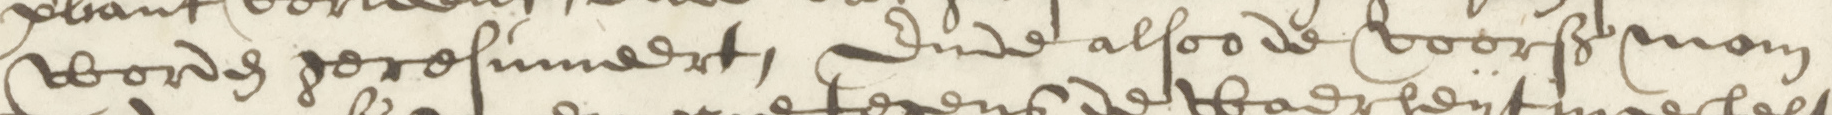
worden geresumeert. Ende alsoo de voors mom
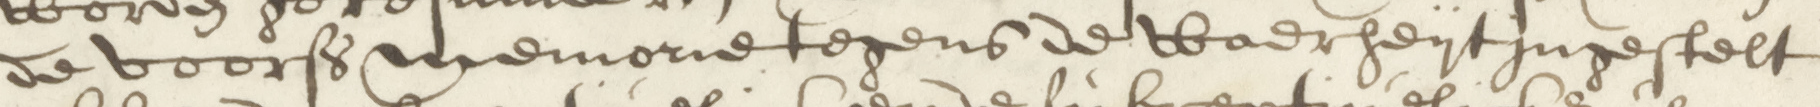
de voors memorie tegens de waerheijt ingestelt
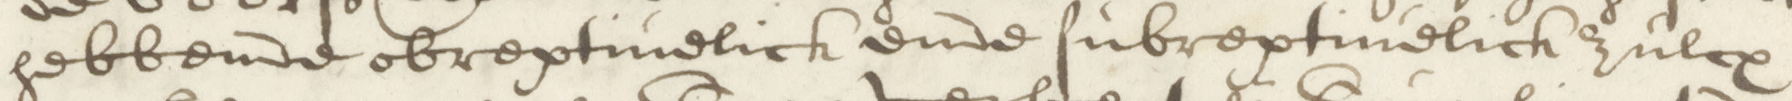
hebbende obreptiuelick ende subreptiuelick zulcx
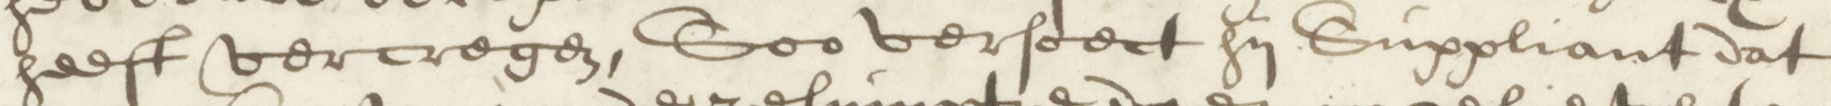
heeft vercregen, Soo versoect hij Suppliant dat
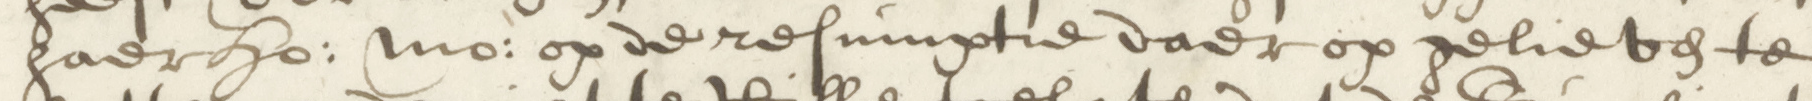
haer Ho:Mo: op de resumptie daer op gelieven te
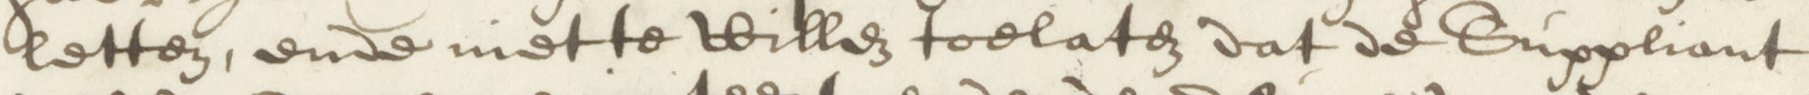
letten, ende niet te willen toelaten dat de Suppliant
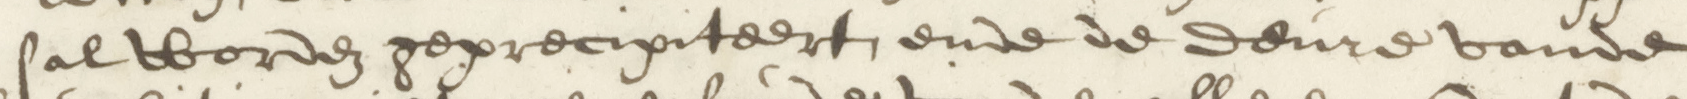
sal worden geprecipiteert, ende de Deure vande
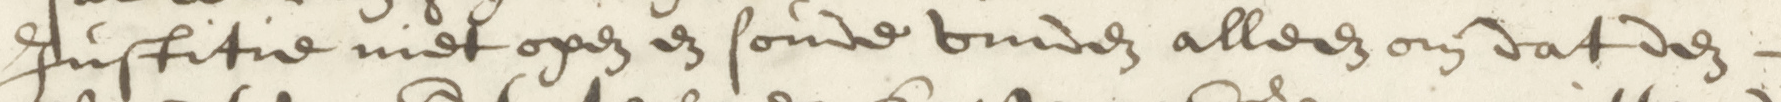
Justitie niet open en soude vinden alleen om dat den
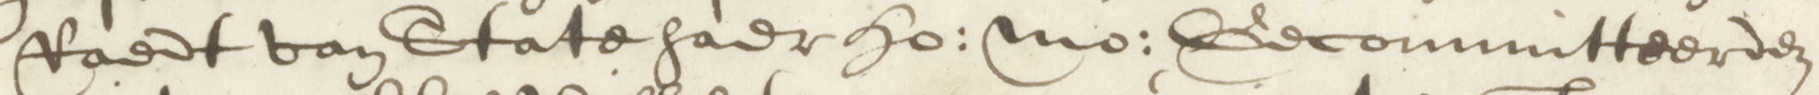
Raedt van State haer Ho:Mo: Gecommitteerden
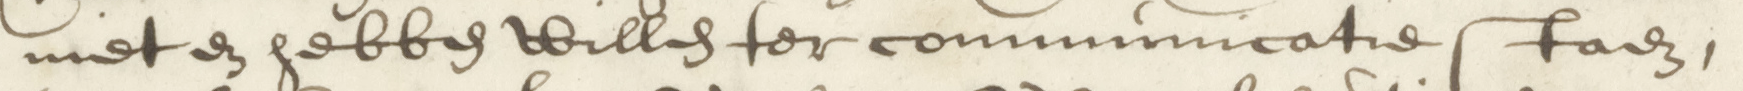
niet en hebben willen ter communicatie staen,
